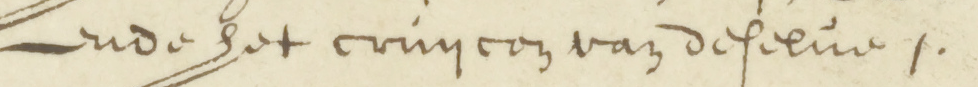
ende het cruycen van deselue.
